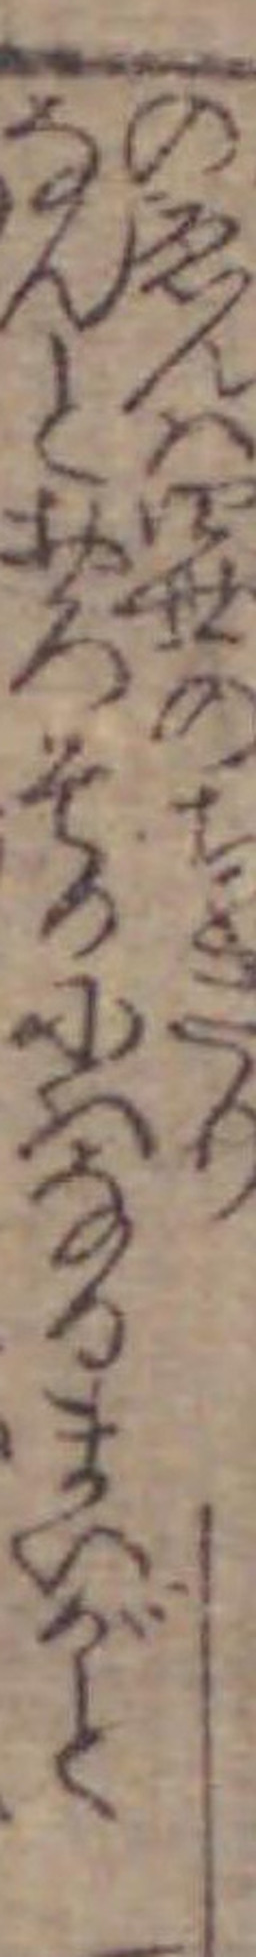なんとおろそかにはなるまいがと
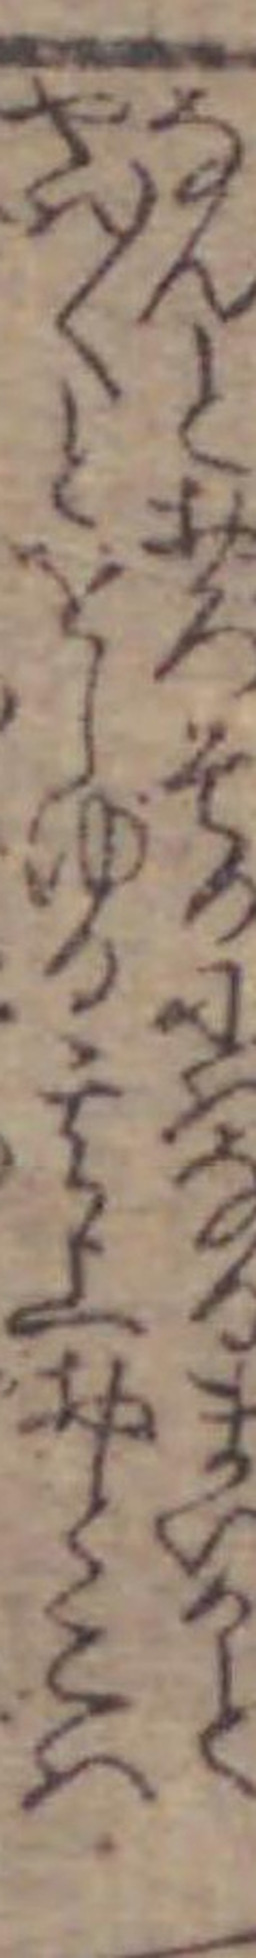やは〳〵とをしゆる其上おとこは
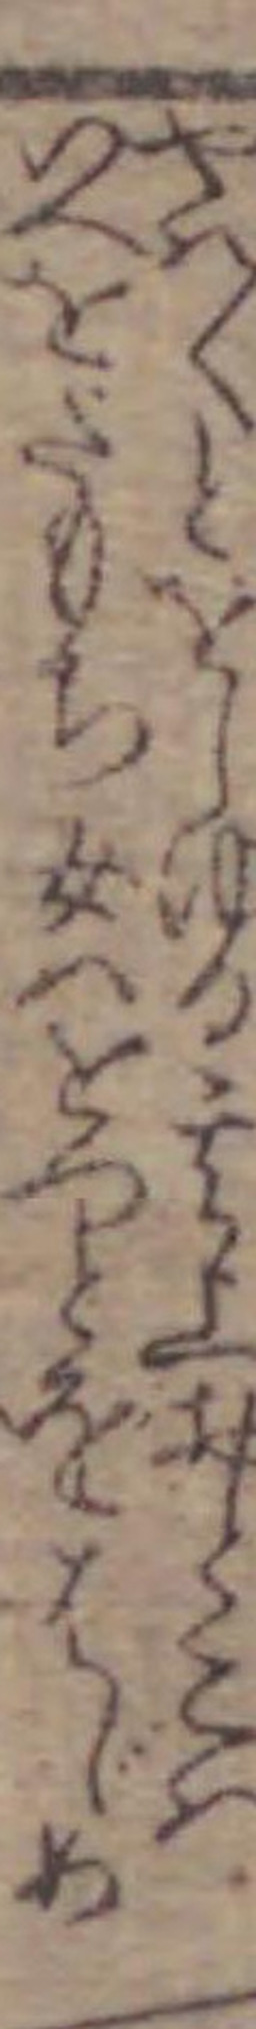いへをたもち女はをつとをはじめ
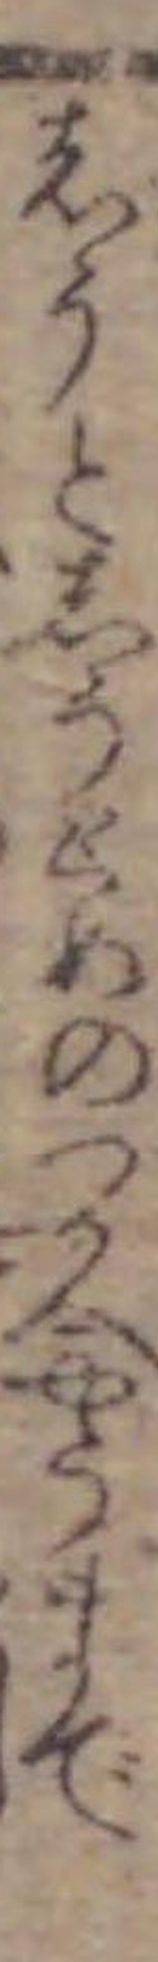しうとしうとめのつかへやうまで
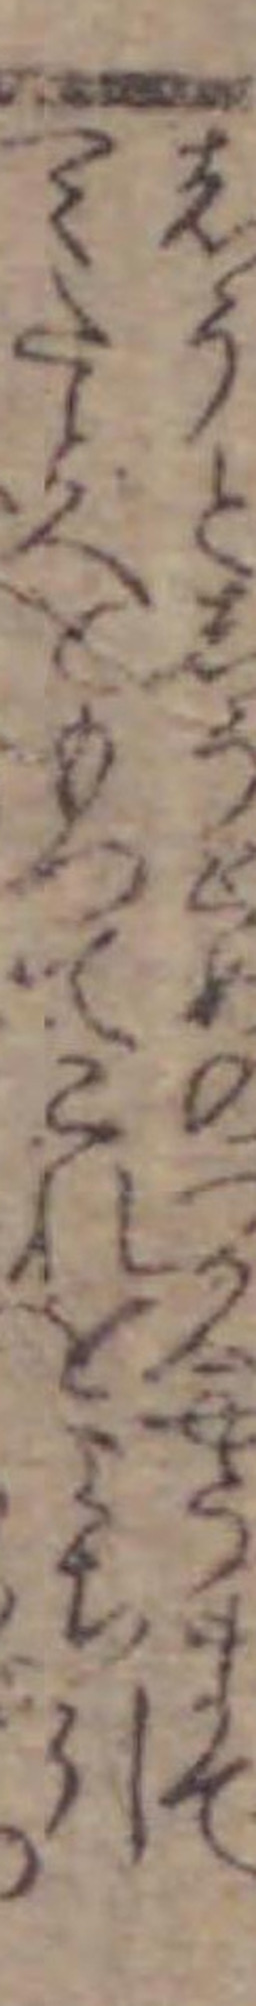一々たとへをもつてこれをみち引
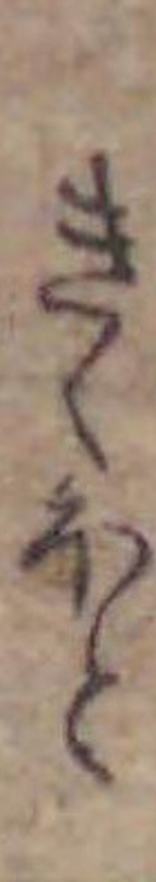きくほと
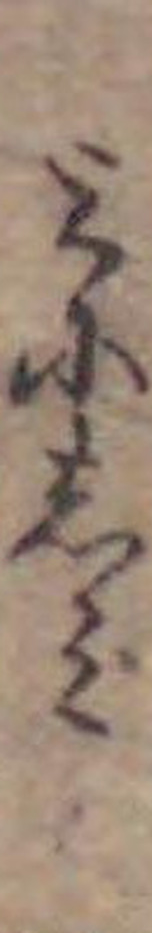みにしみ
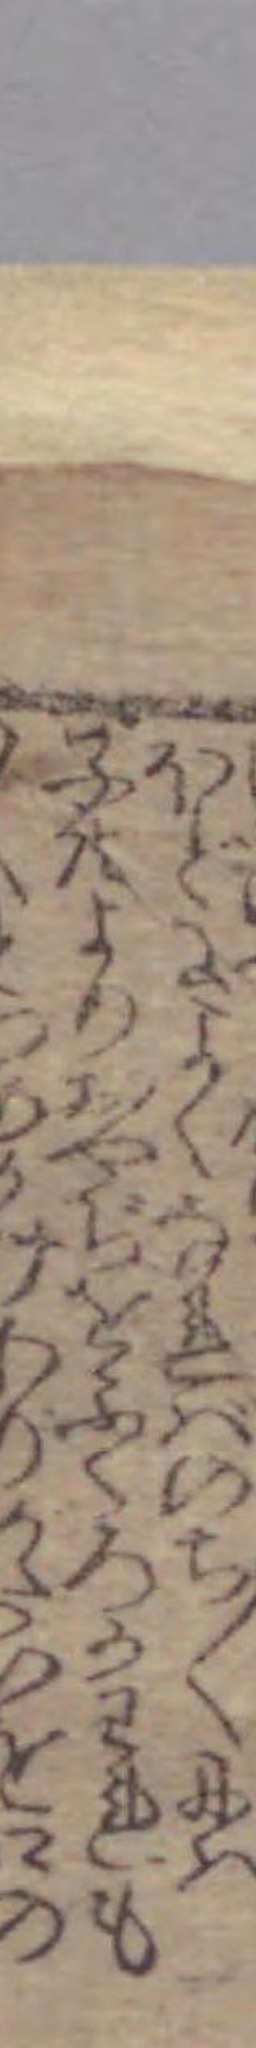子共よりおやぢをふくろかわれも
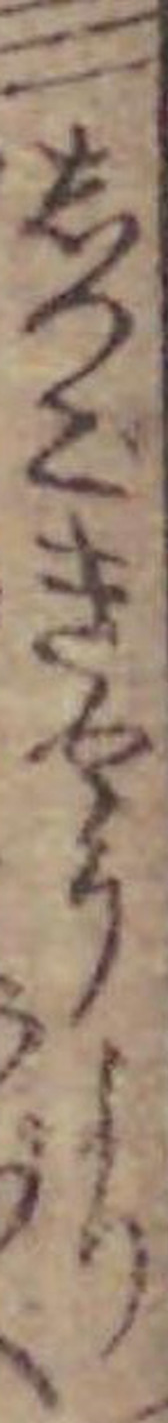しつこきやうより
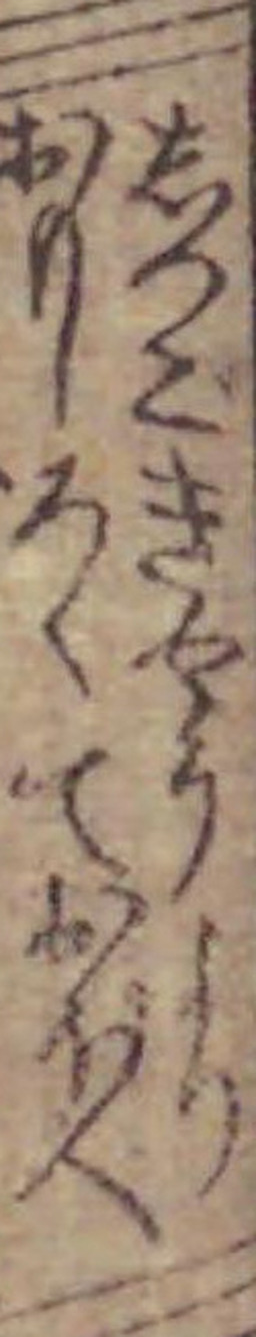おもしろくておぼへ
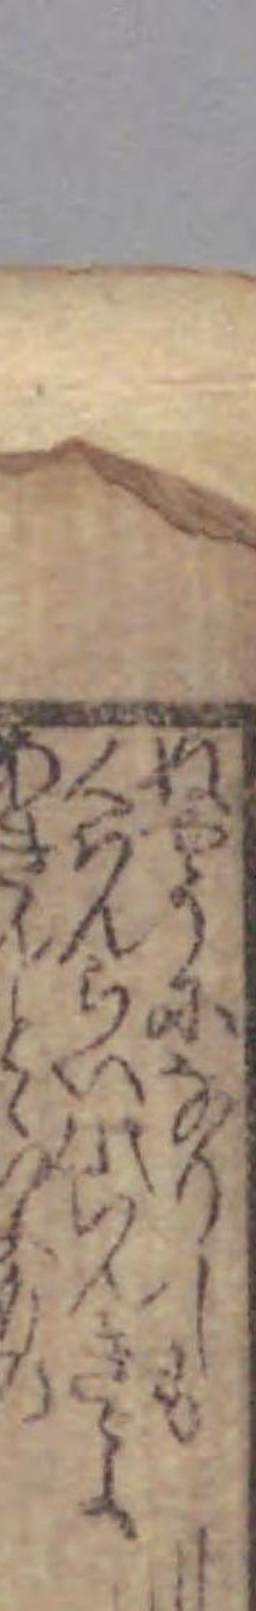くはんらい此いんきよ
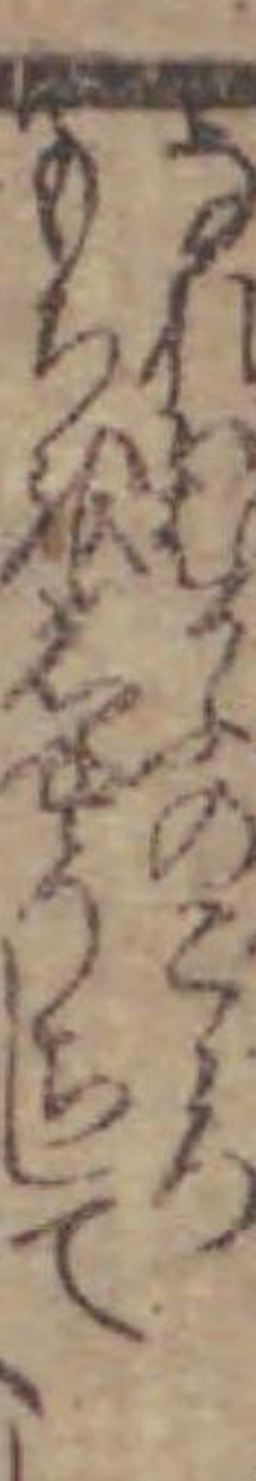もちをしやうちして
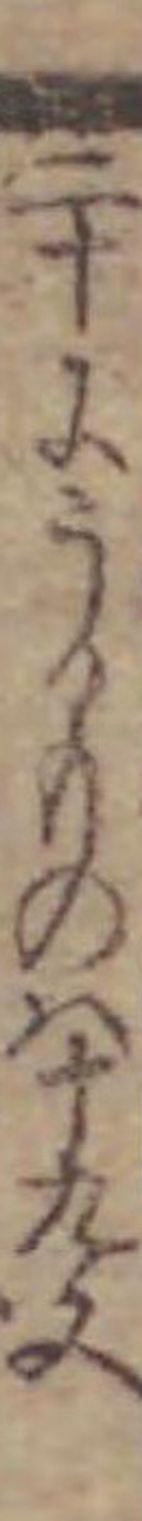二十にうるものは十九文
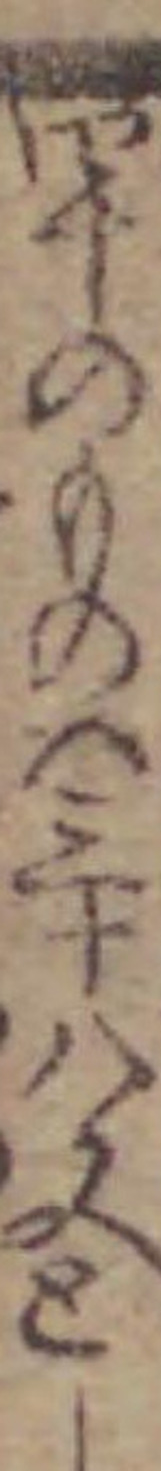四十のものは三十八文と
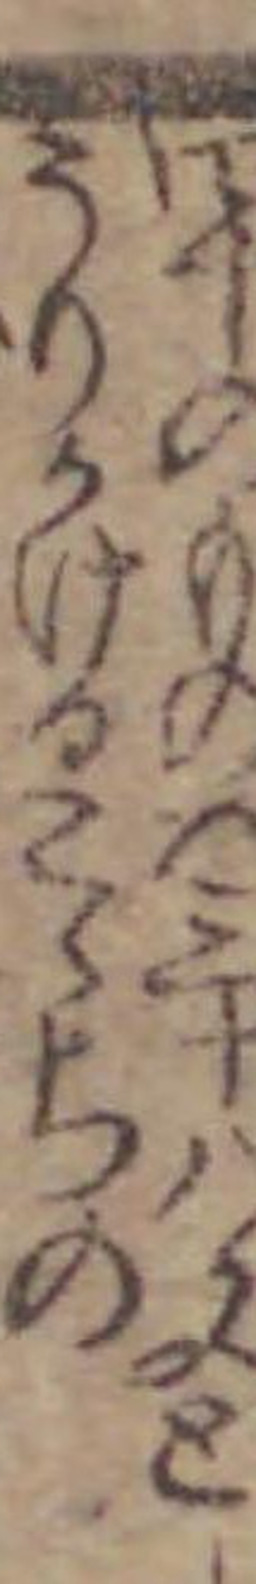うりかけるこゝちの
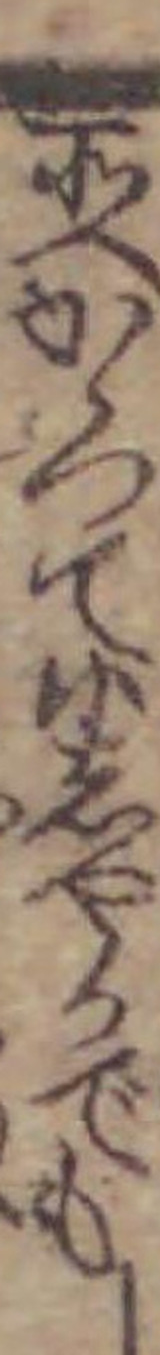所へかゝつて御しやかでも
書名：即席耳学問 : 3巻
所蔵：国立国会図書館 National Diet Library, JAPAN
